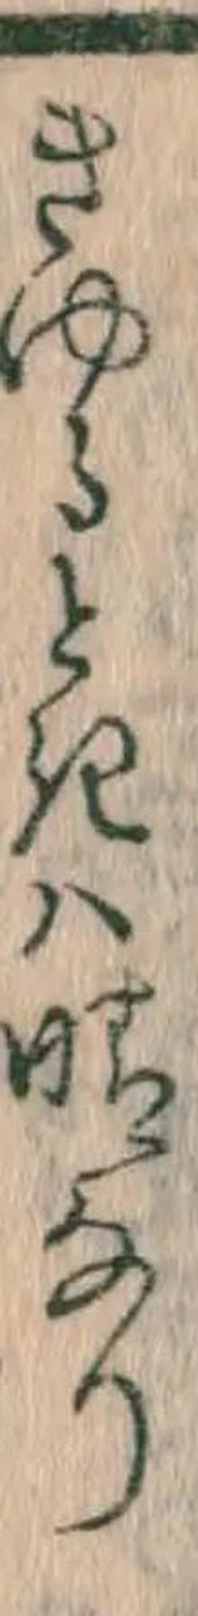さゆるときは晴なり
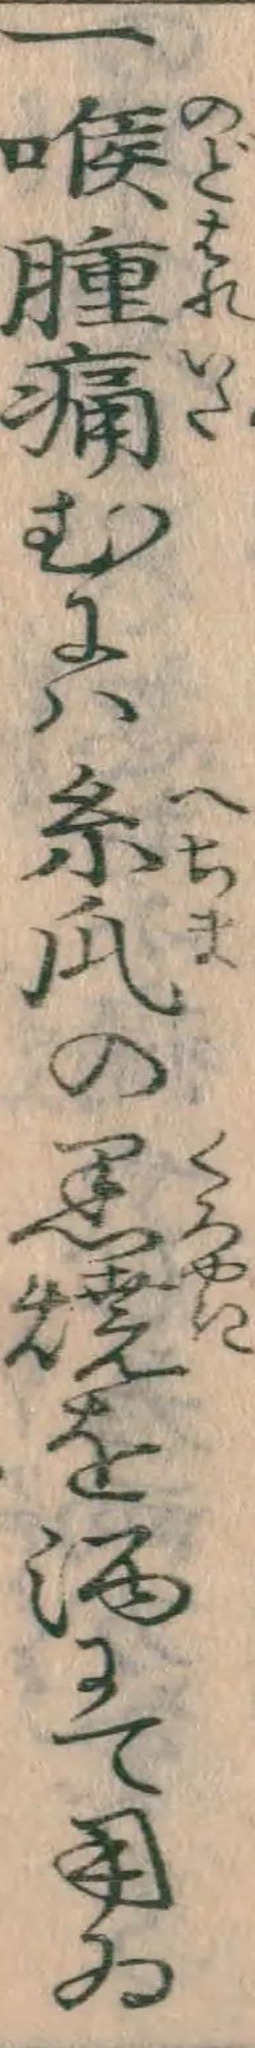一喉腫痛むには糸瓜の黒焼を酒にて用ゐ
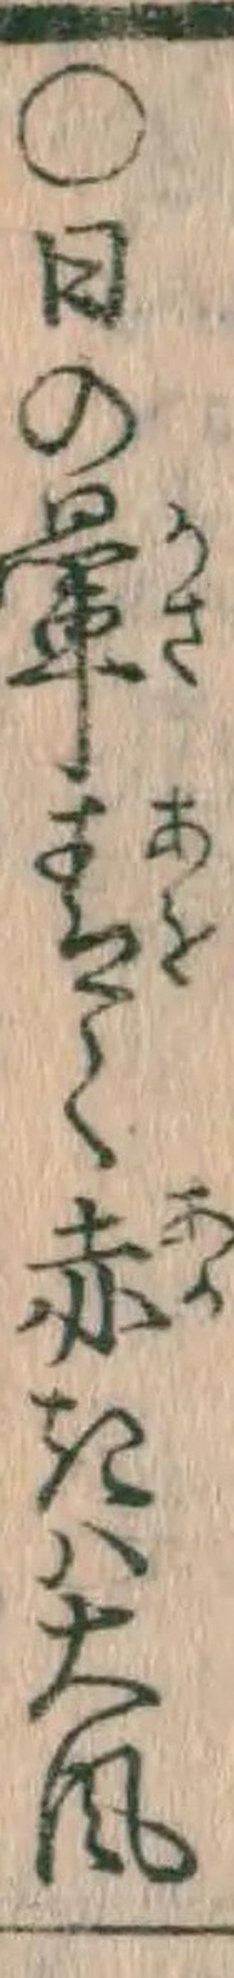○日の暈青く赤きは大風
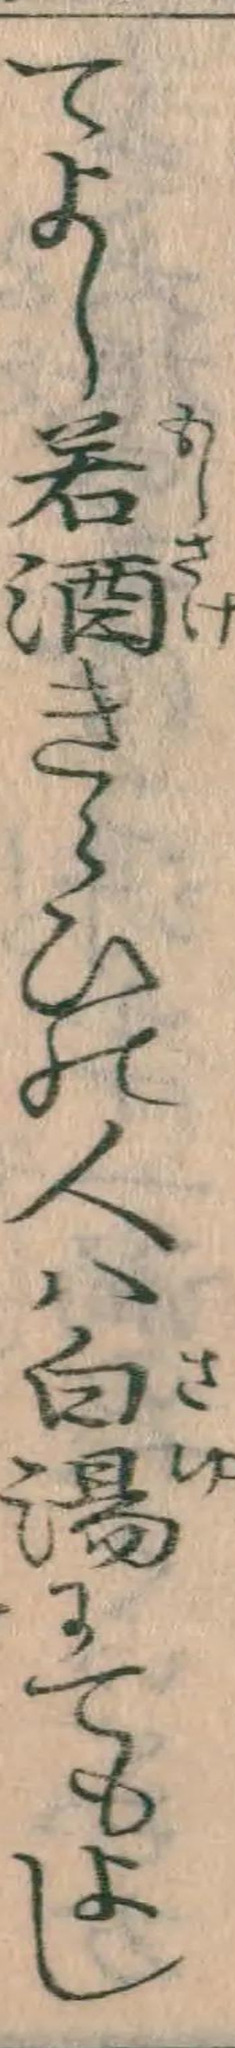てよし若酒きらひの人は白湯にてもよし
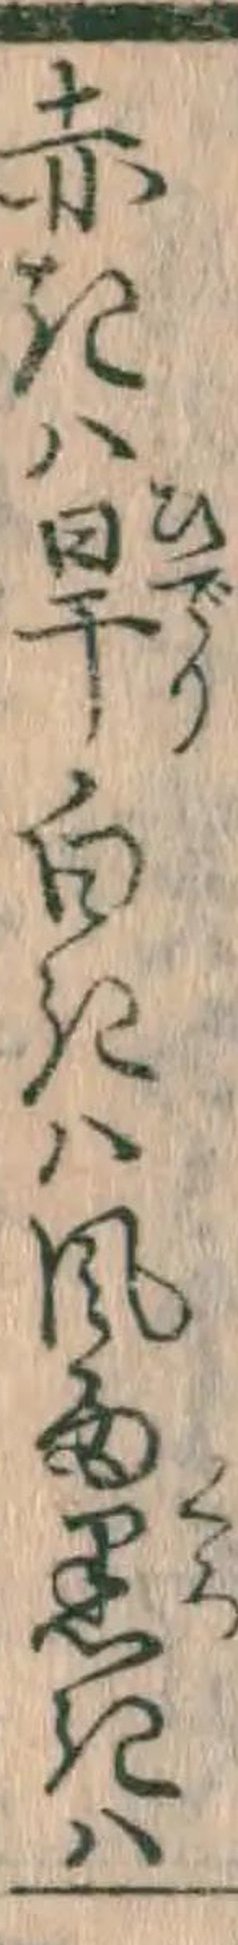赤きは旱白きは風雨黒きは
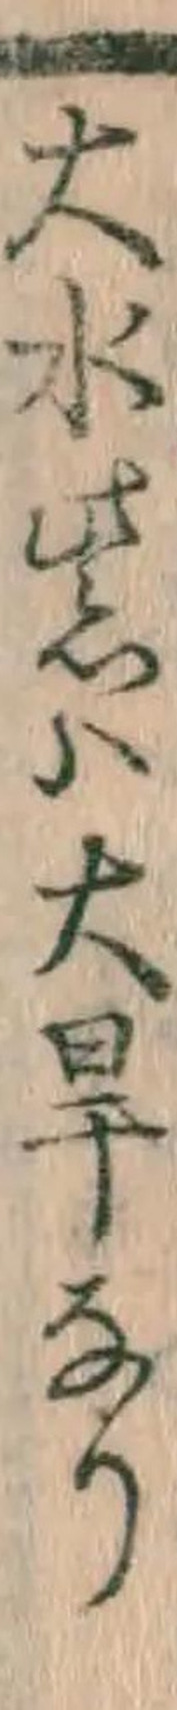大水紫は大旱なり
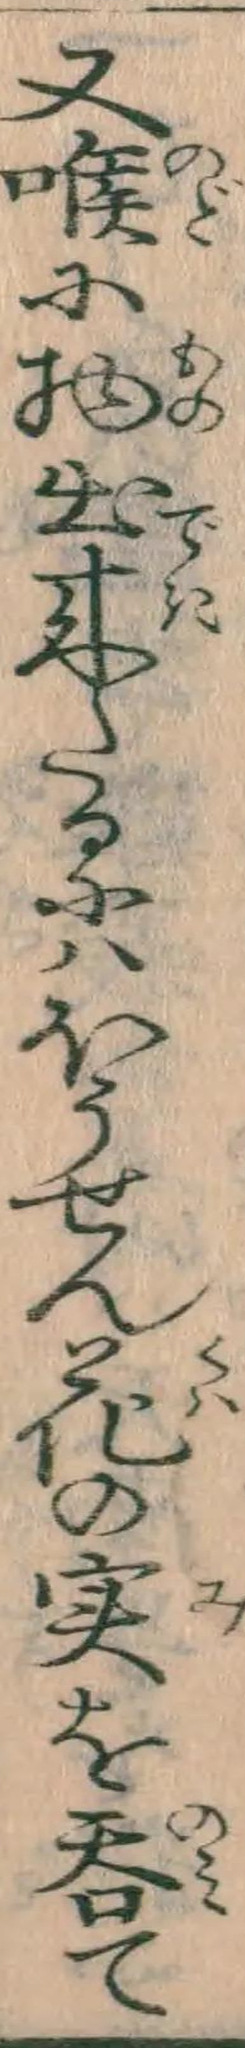又喉に物出来たるにはほうせん花の実を吞て
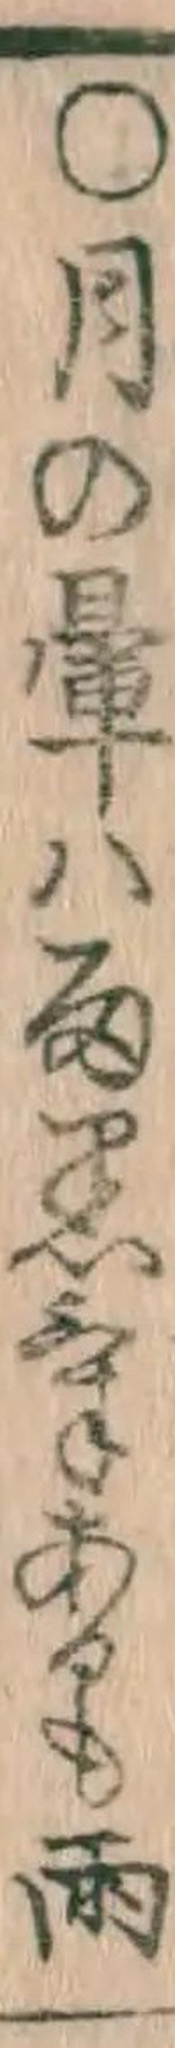○月の暈は雨黒気あるも雨
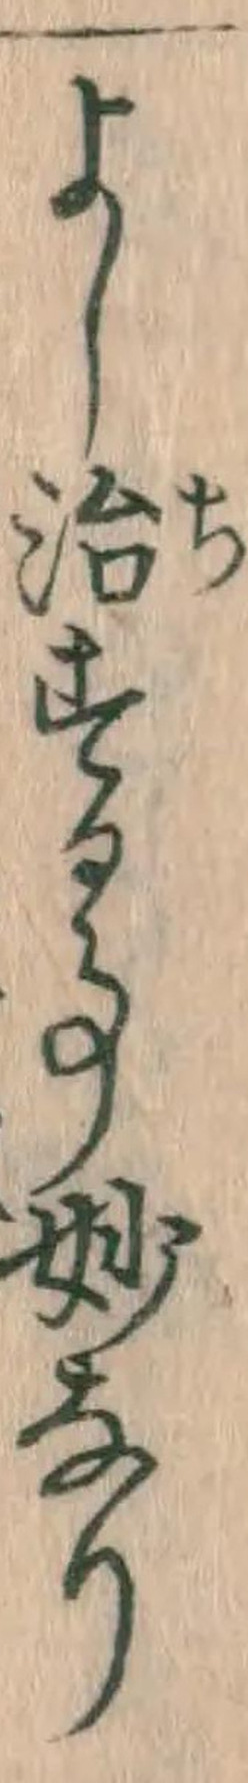よし治する事妙なり
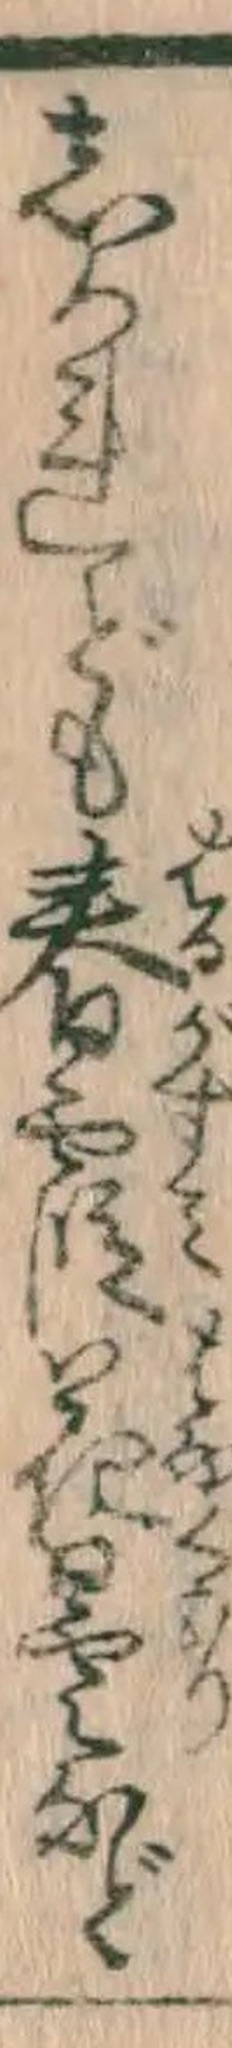しかれども春霞花曇など
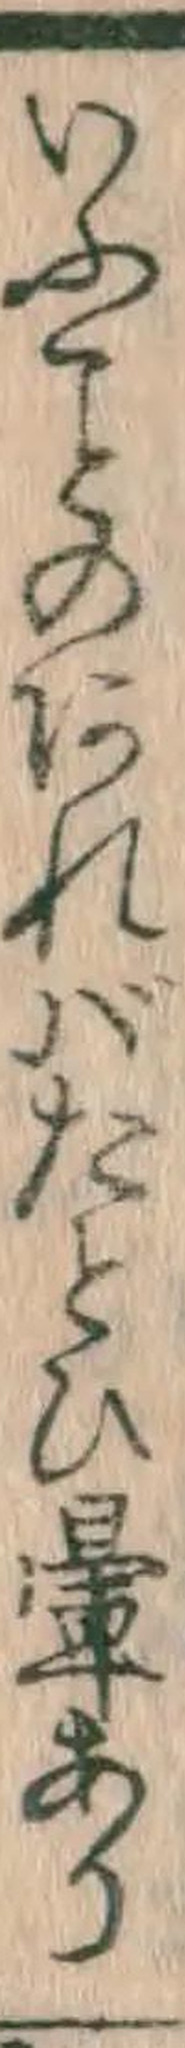いふことのあればたとひ暈あり
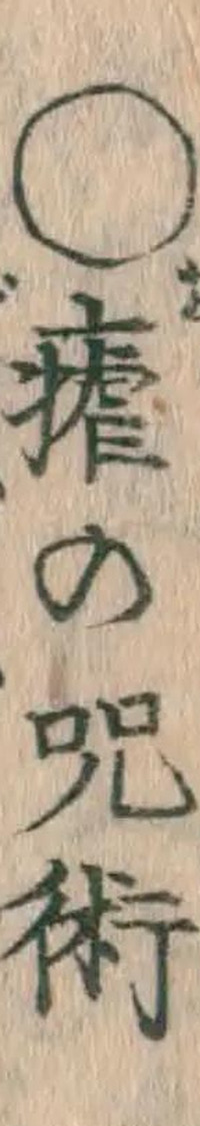○瘧の呪術
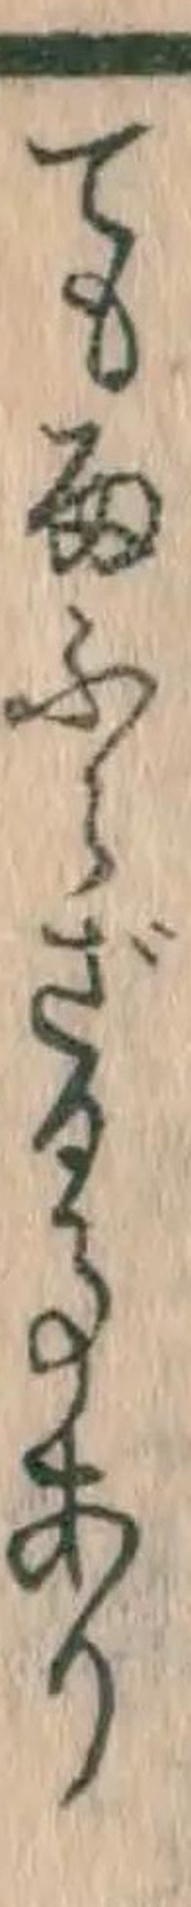ても雨ふらざる事あり
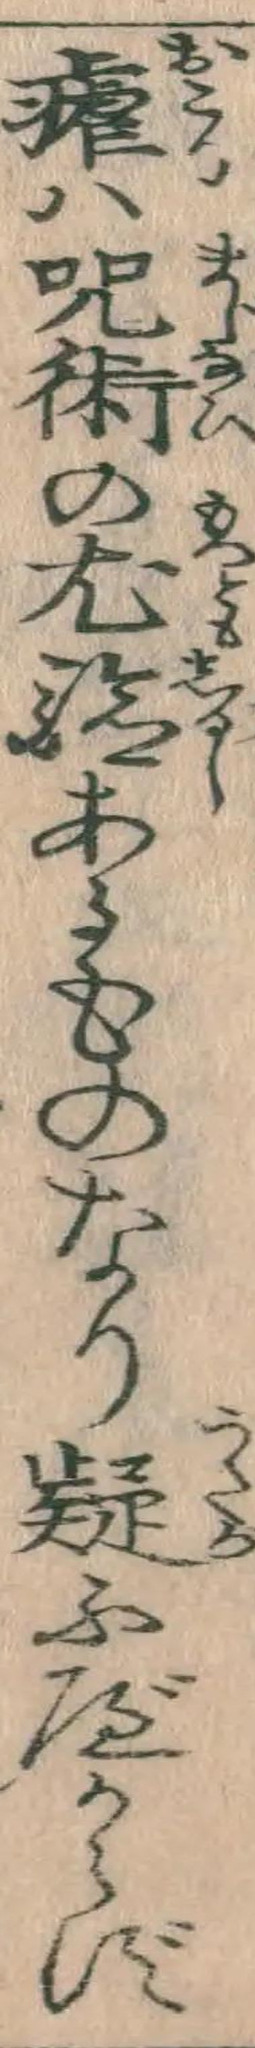瘧は呪術の尤験あるものなり疑ふべからず
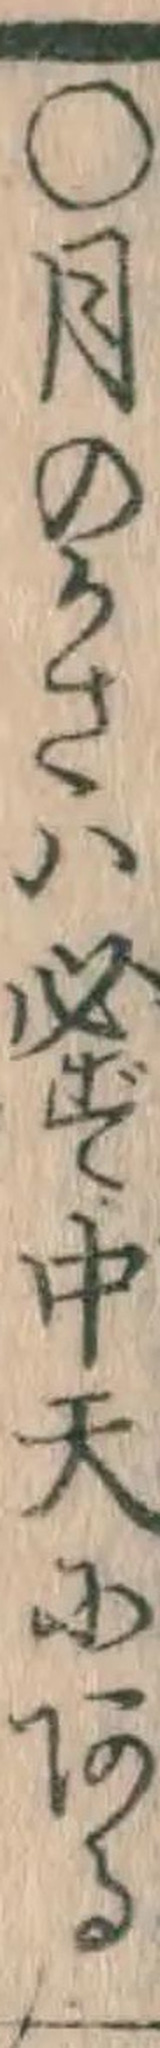○月のかさは必ず中天にある
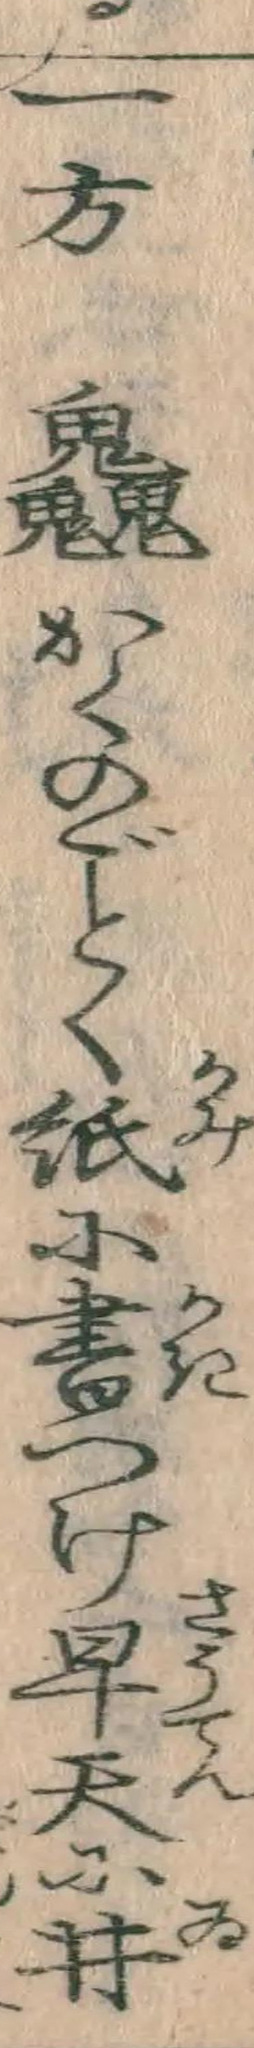一方かくのごとく紙に書つけ早天に井
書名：広益秘事大全 3巻. [3]
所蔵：国立国会図書館 National Diet Library, JAPAN
